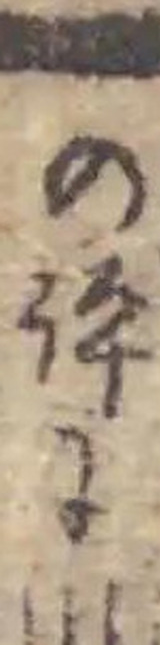の評に
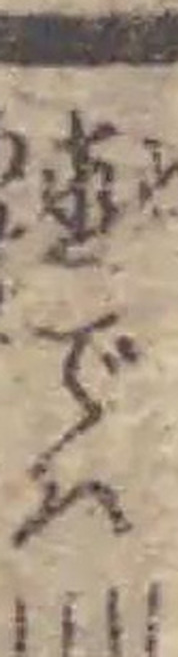直では
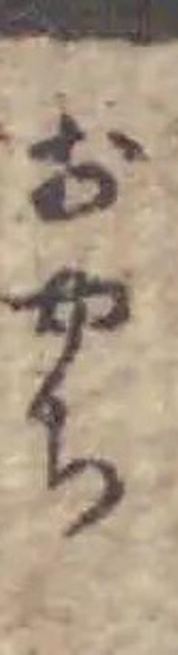おやち
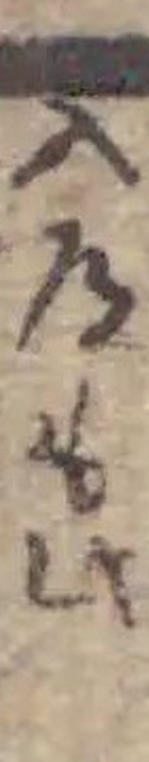入道も此
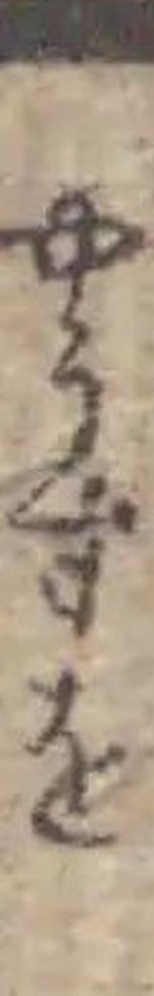やうすを
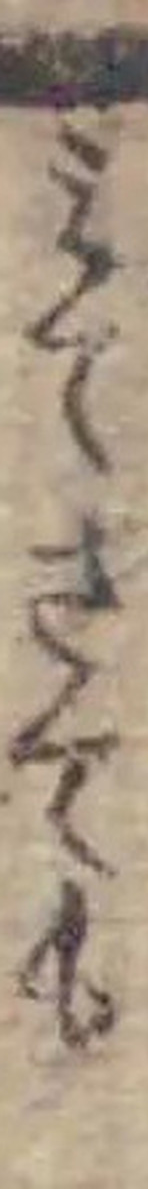みてさても
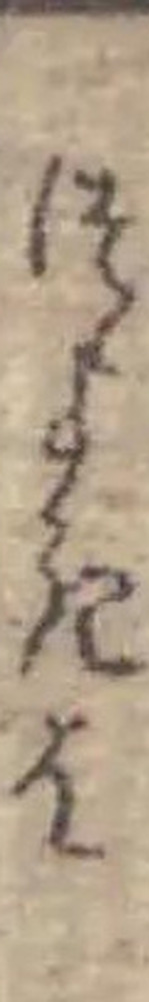つよきは
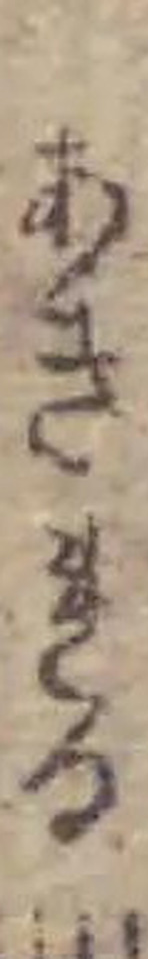あきれる

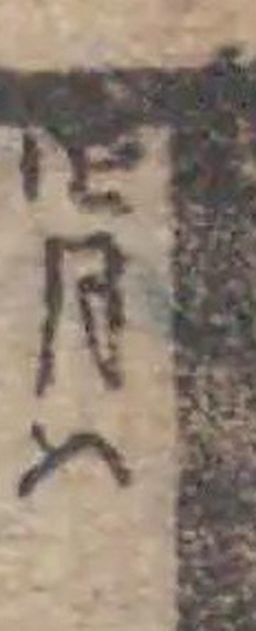四月は
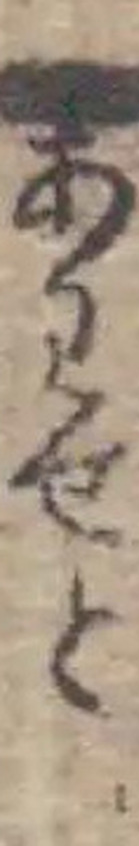あわせと
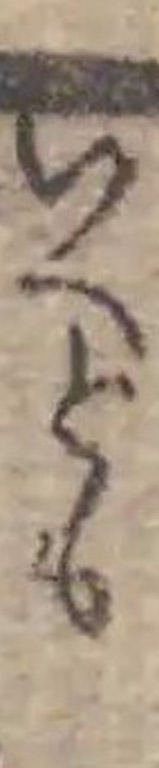いへとも
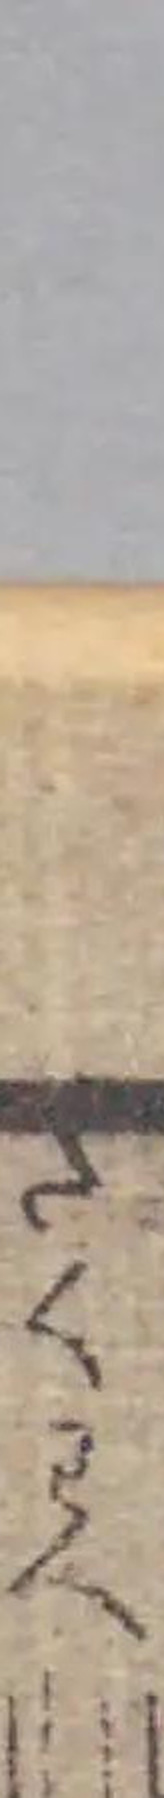たくわへ
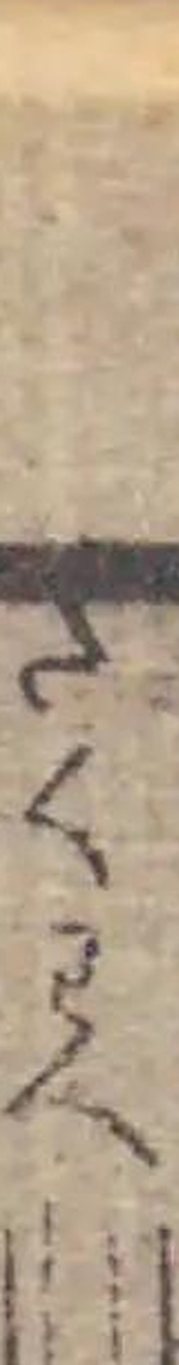たくわへ
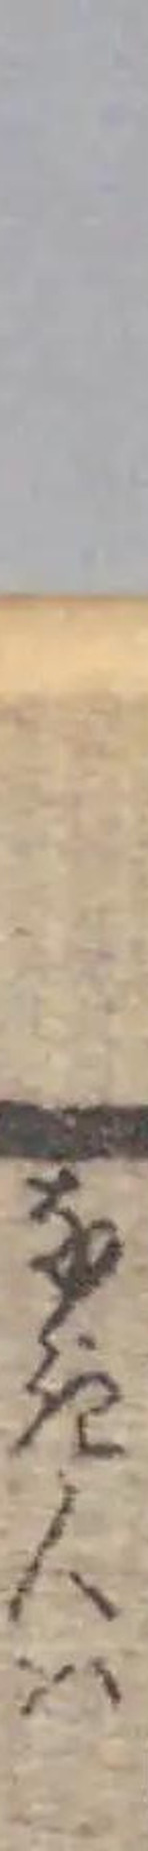なき人は
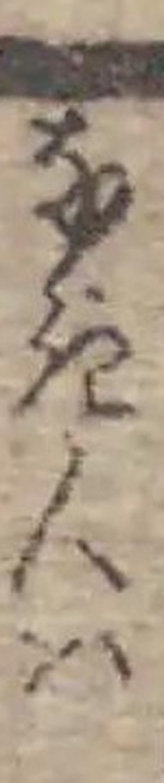なき人は
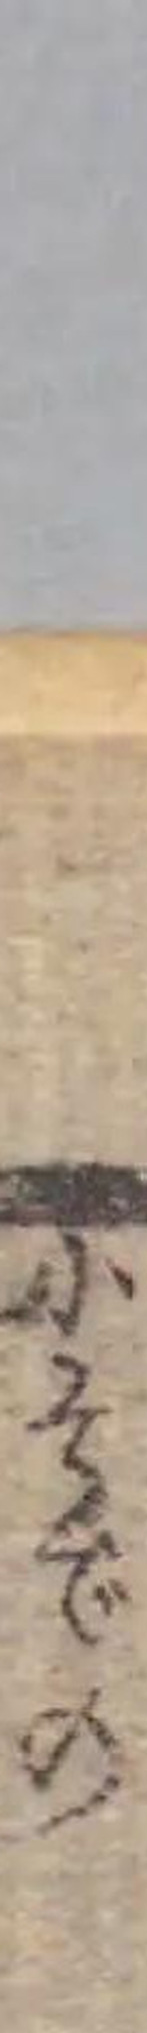こそでの
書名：作意妖恐懼感心 2巻
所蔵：国立国会図書館 National Diet Library, JAPAN
